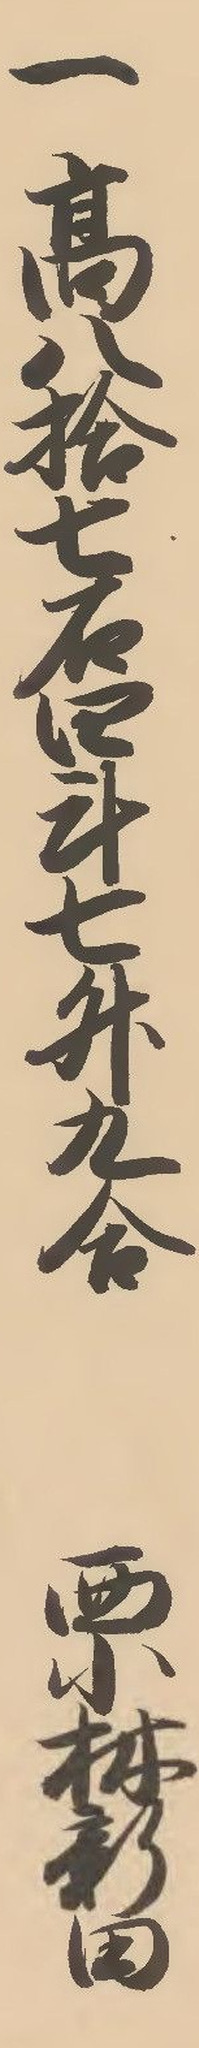一高八拾七石四斗七升九合西小林新田
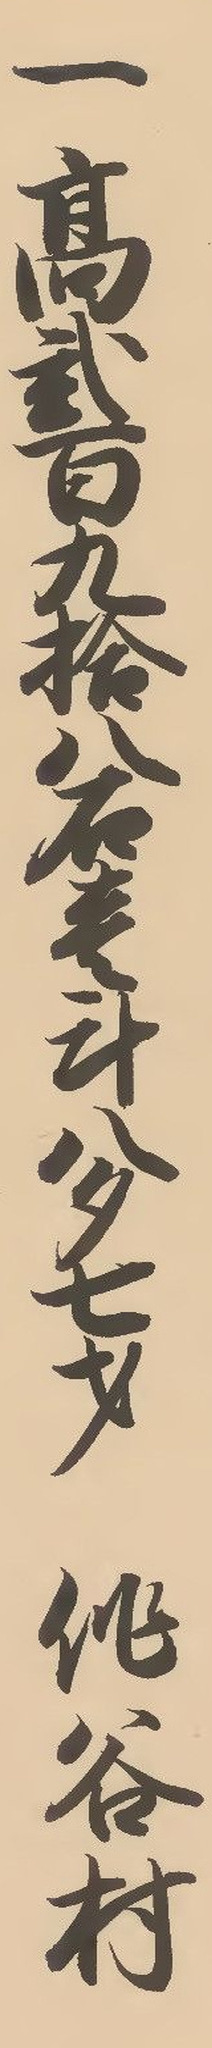一高弐百九拾八石壱斗八勺七才作谷村
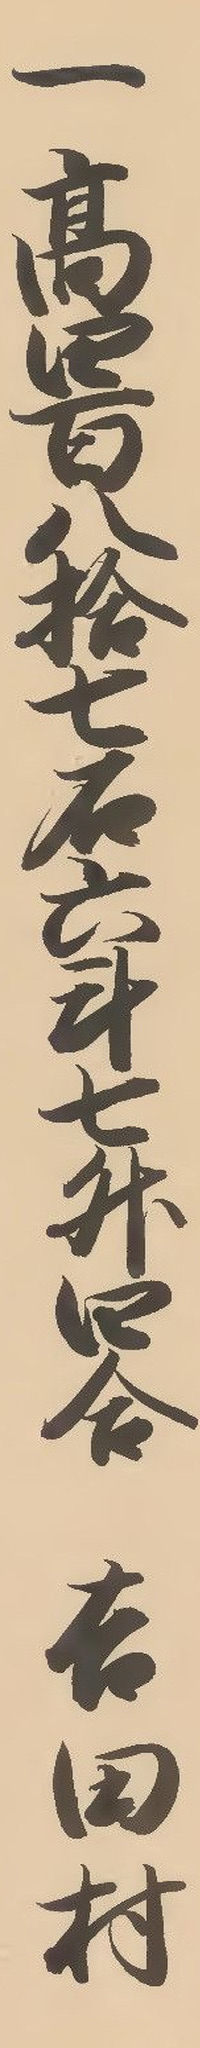一高四百八拾七石六斗七升四合吉田村
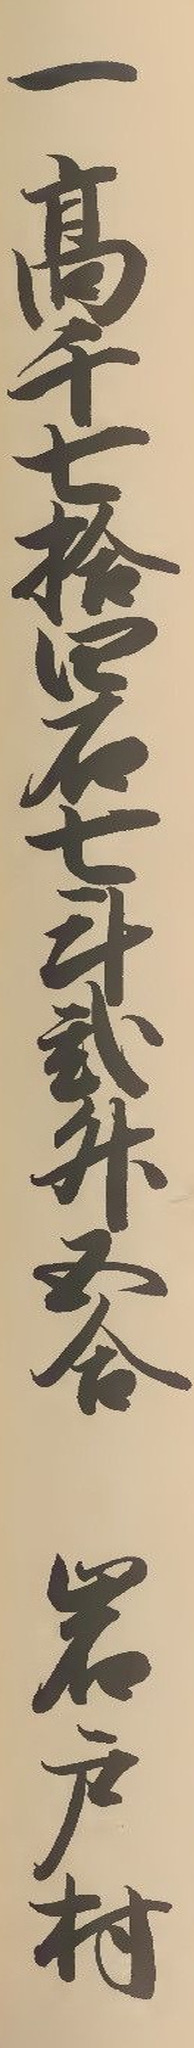一高千七拾四石七斗弐升五合岩戸村
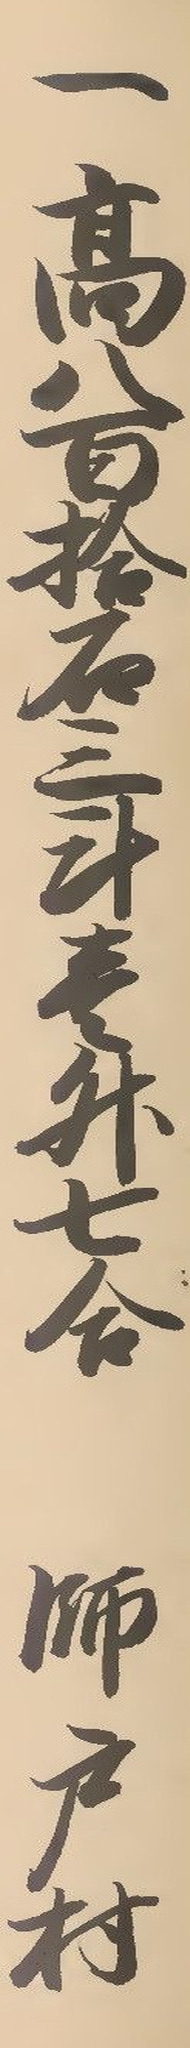一高八百拾石三斗壱升七合師戸村
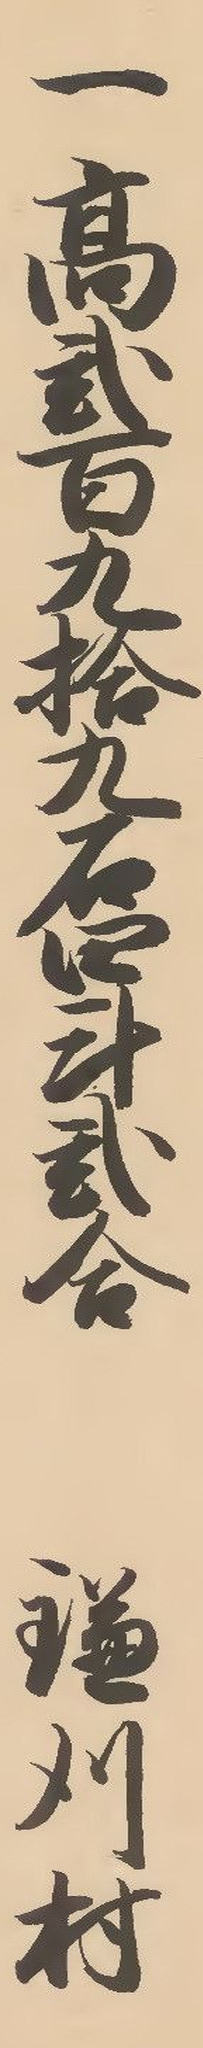一高弐百九拾九石四斗弐合鎌刈村
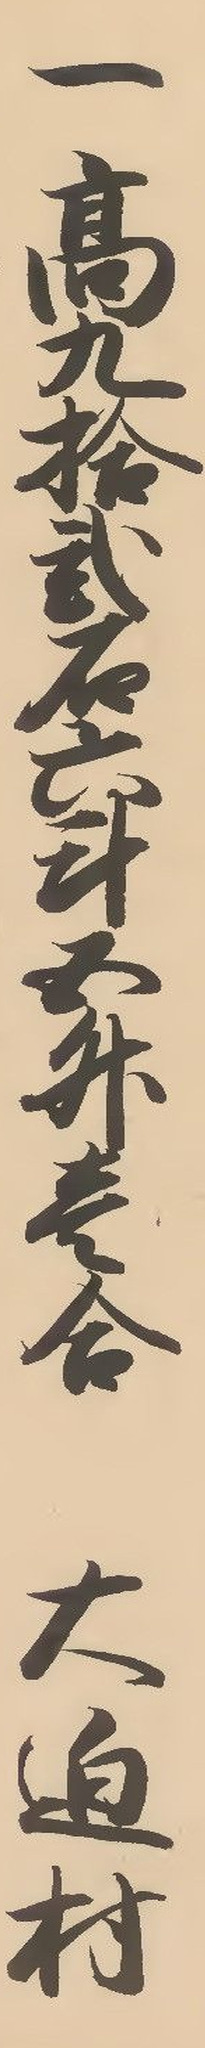一高九拾弐石六斗五升壱合大廻村
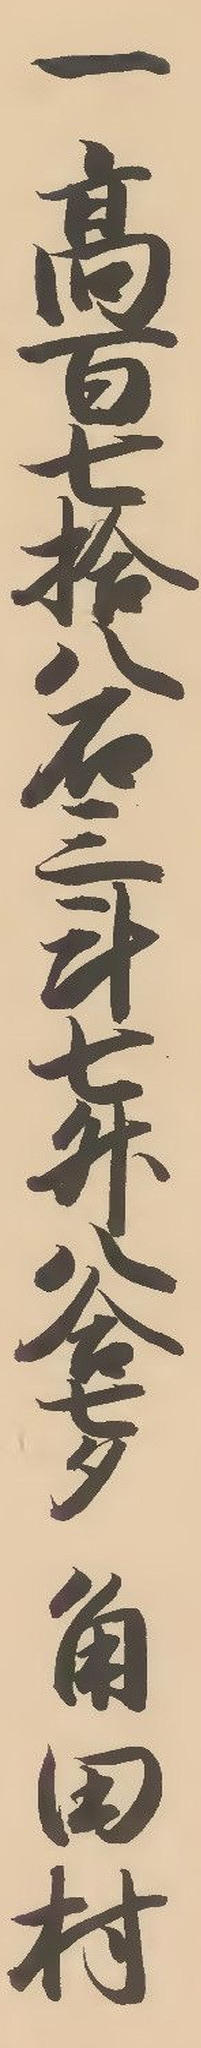一高百七拾八石三斗七升八合七勺角田村

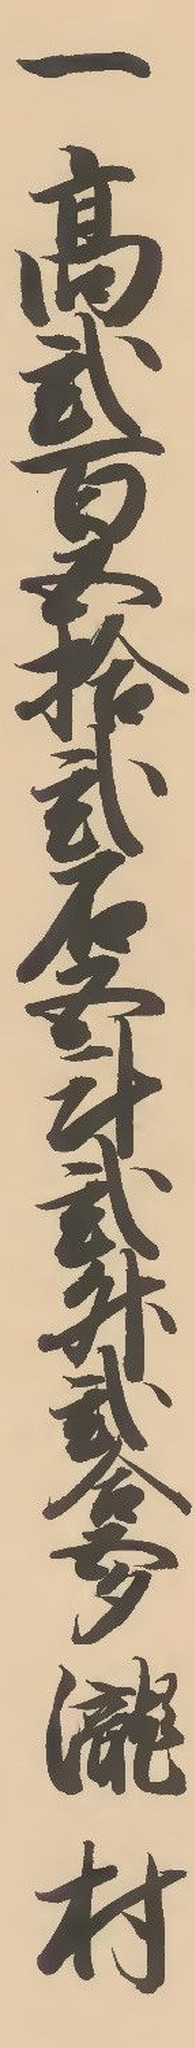一高弐百五拾弐石五斗弐升弐合五勺滝村
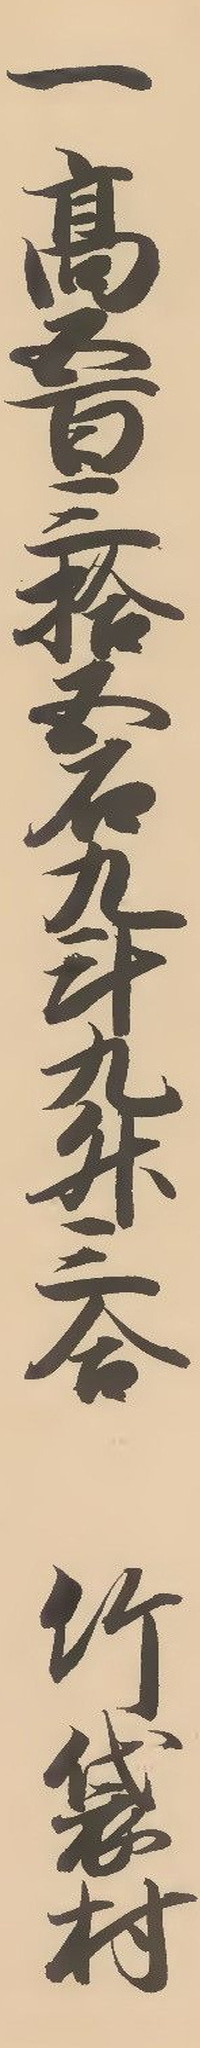一高五百三拾五石九斗九升三合竹袋村
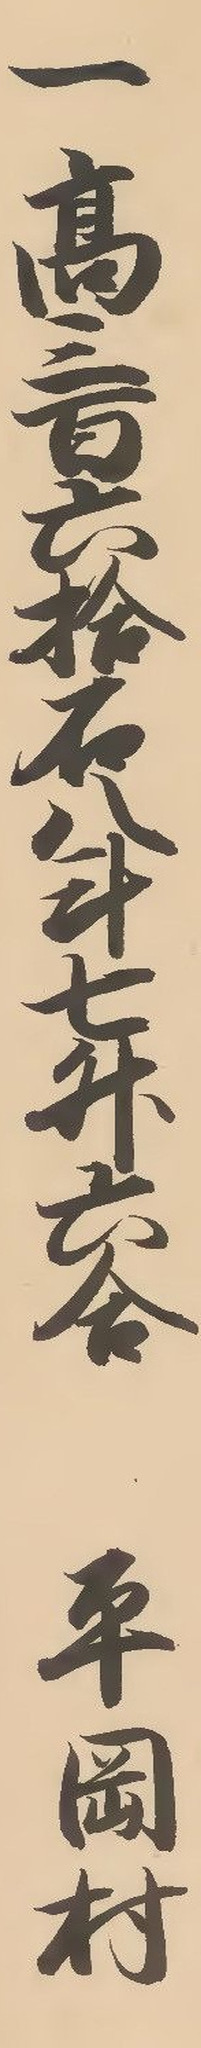一高三百六拾石八斗七升六合平岡村
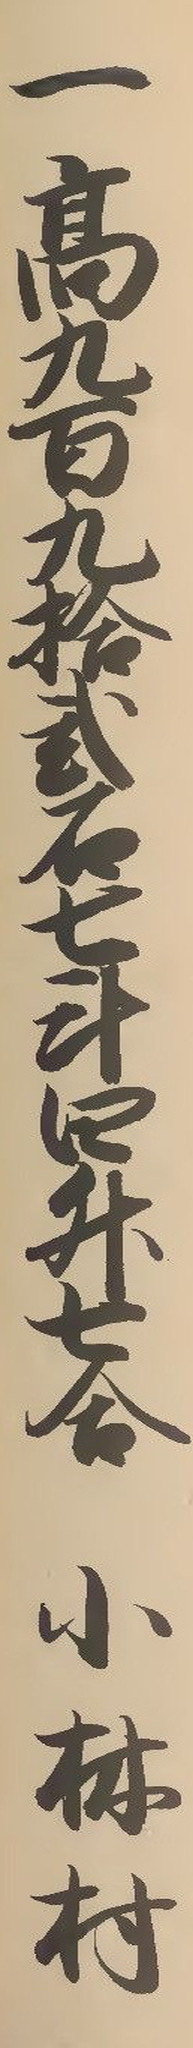一高九百九拾弐石七斗四升七合小林村
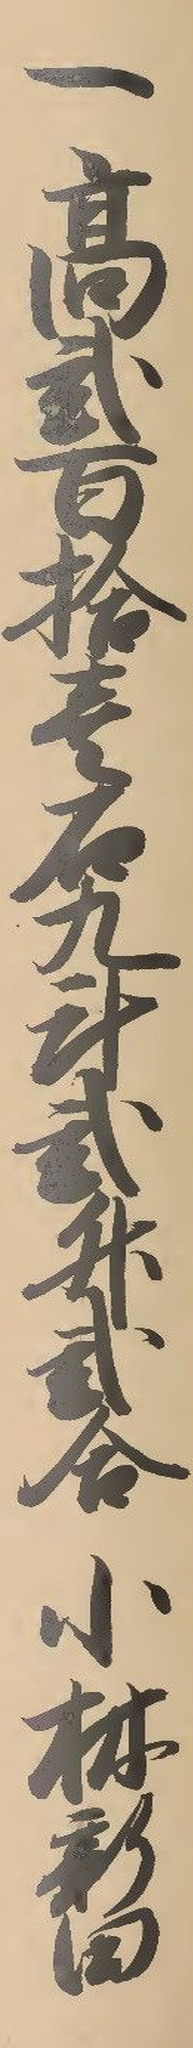一高弐百拾壱石九斗弐升弐合小林新田
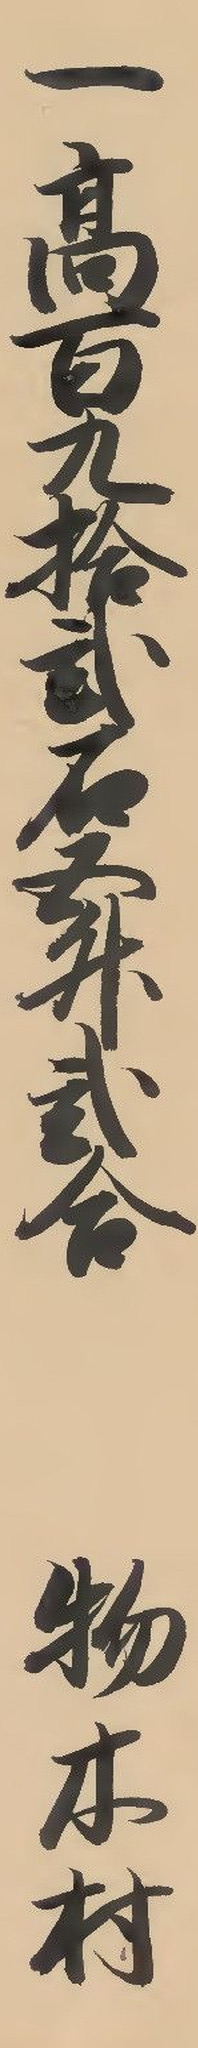一高百九拾弐石五升弐合物木村
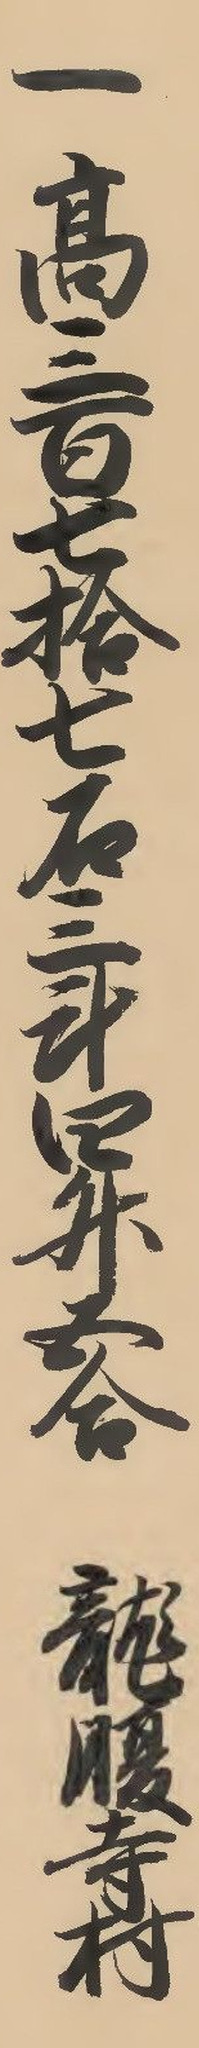一高三百七拾七石三斗四升五合龍腹寺村
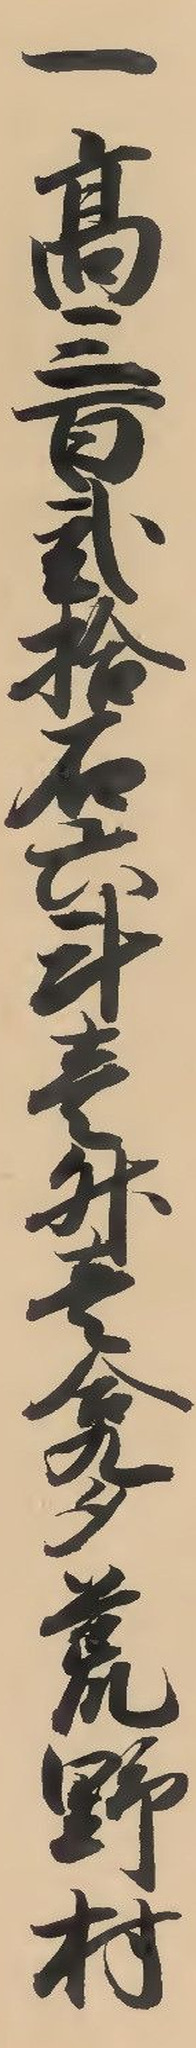一高三百弐拾石六斗壱升壱合九勺荒野村
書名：下総国郷帳
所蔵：国立公文書館 National Archives of Japan
